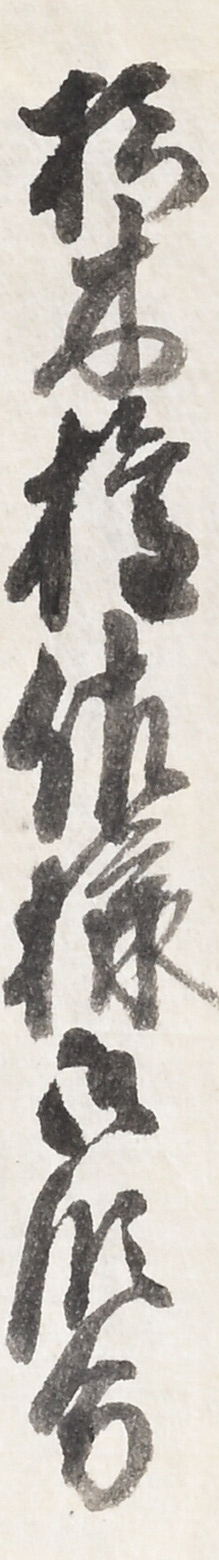朽木権佐様御領分
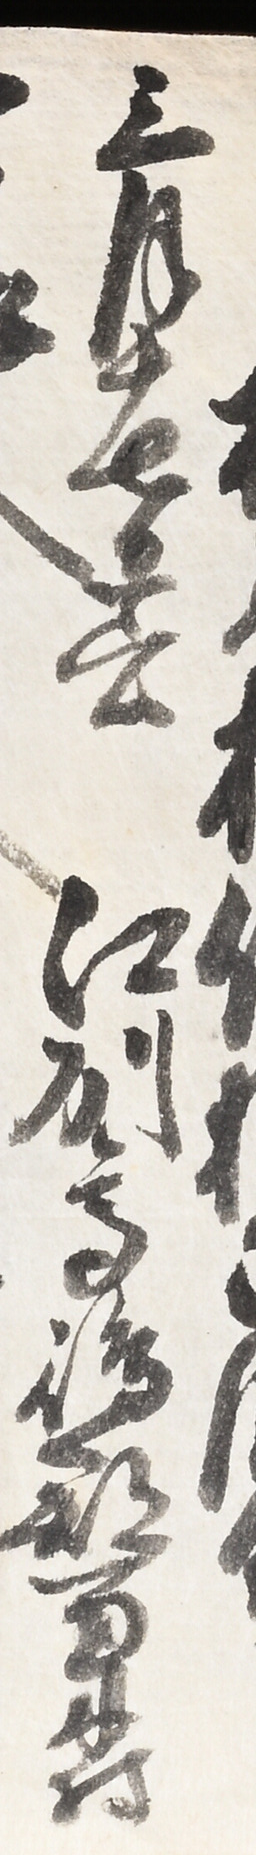三月十七日着江州高嶋郡万木村
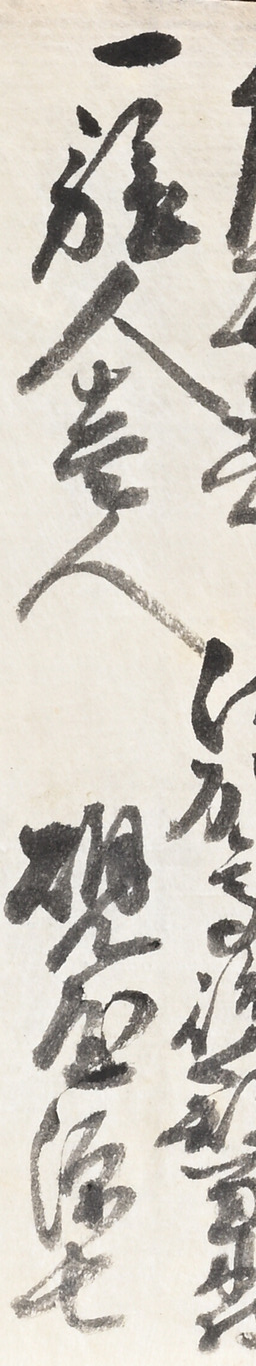一旅人壱人硯屋源七
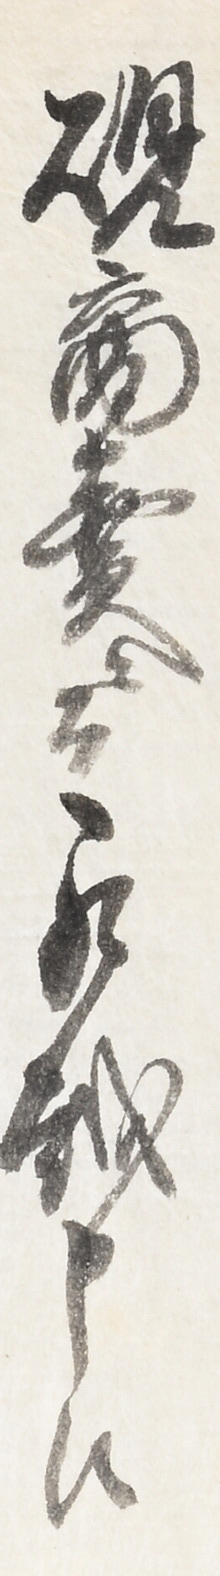硯商売ニ而罷越申候
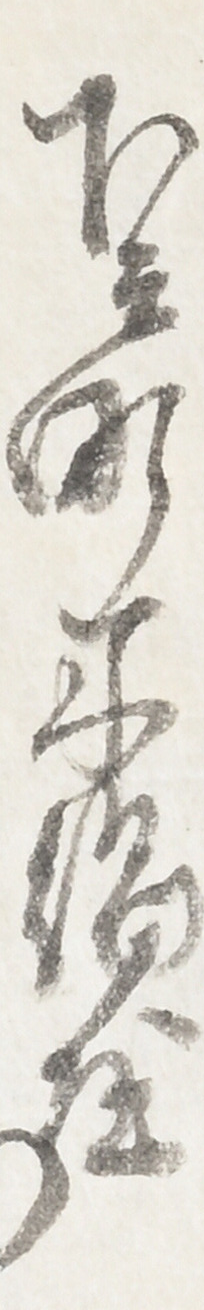下モ町木曽屋
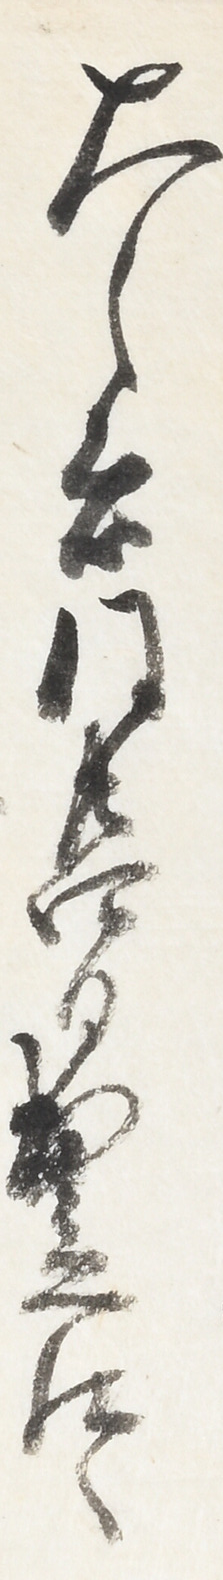右之者同廿四日出立仕候
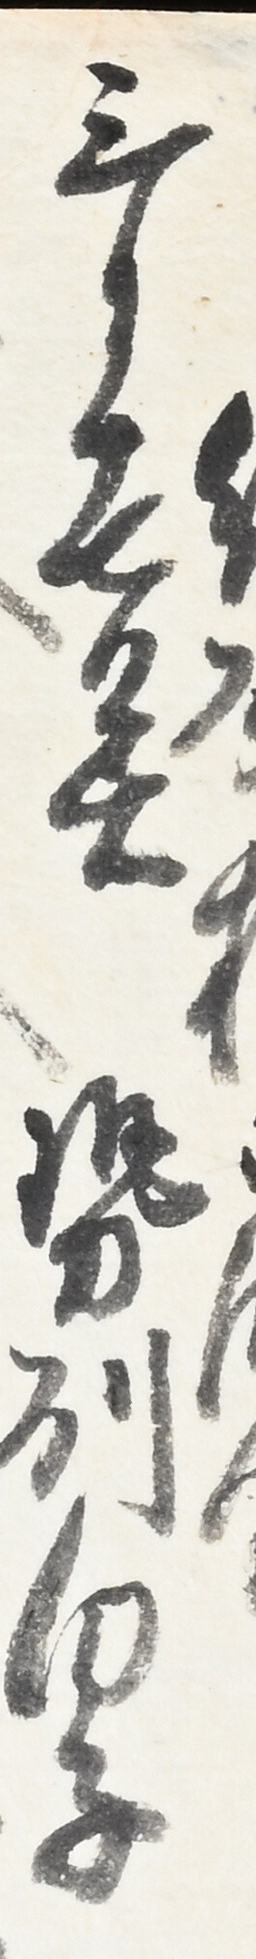三月十七日着勢州白子
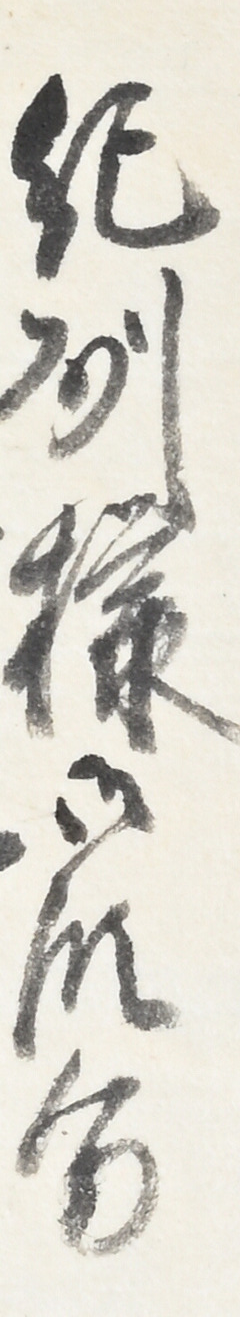紀州様御領分
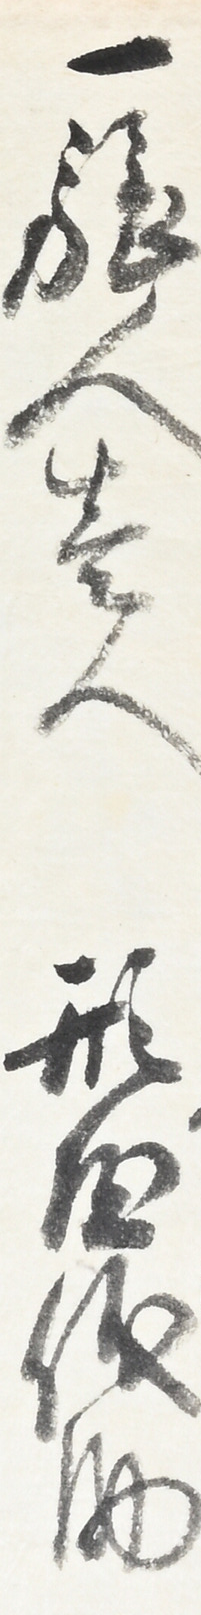一旅人壱人形屋儀助
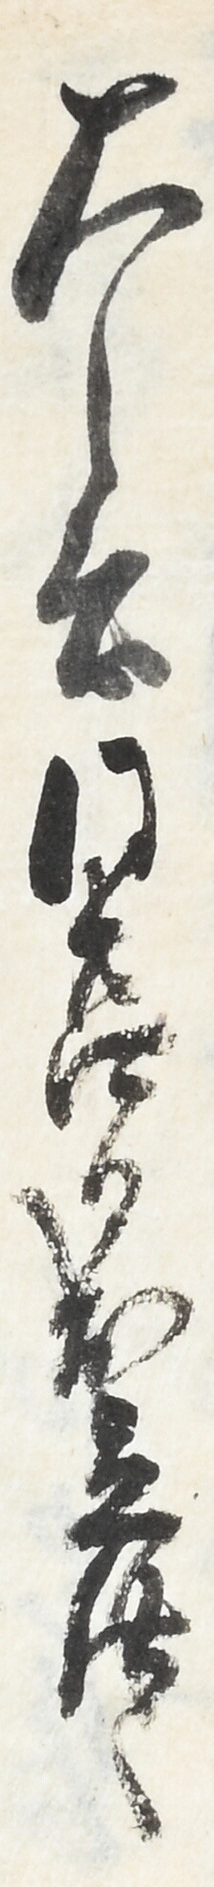右之者同廿四日出立仕候

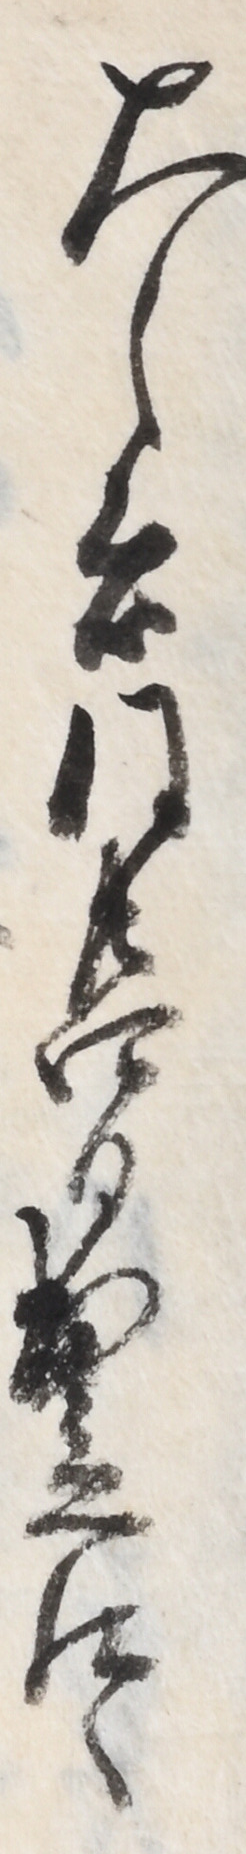右之者同廿四日出立仕候
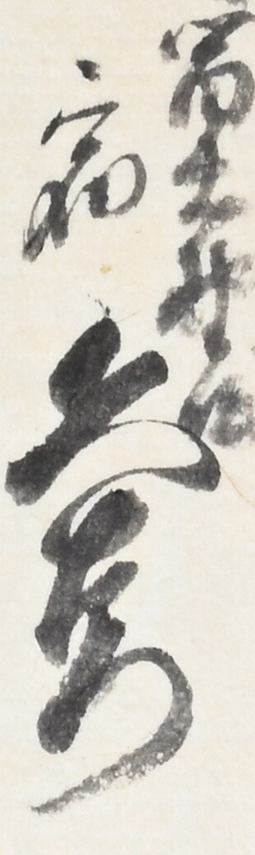宿久右衛門
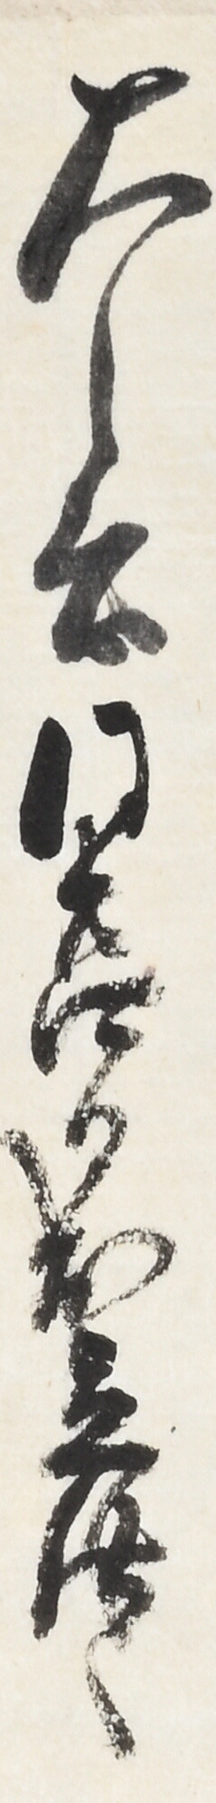右之者同廿四日出立仕候
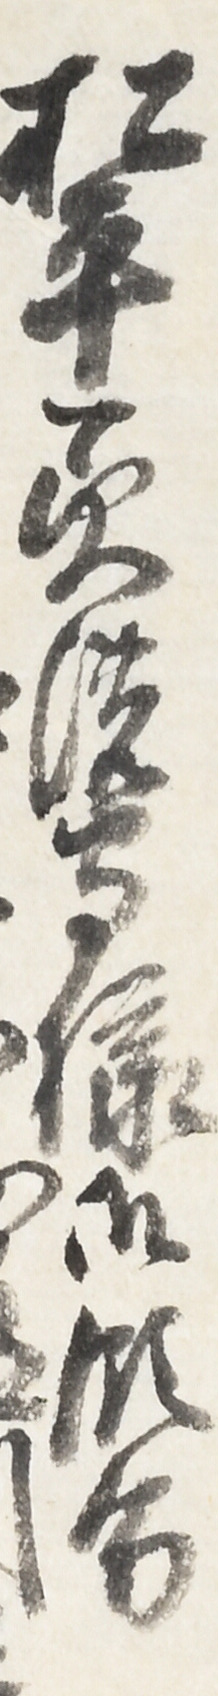松平美濃守様御領分
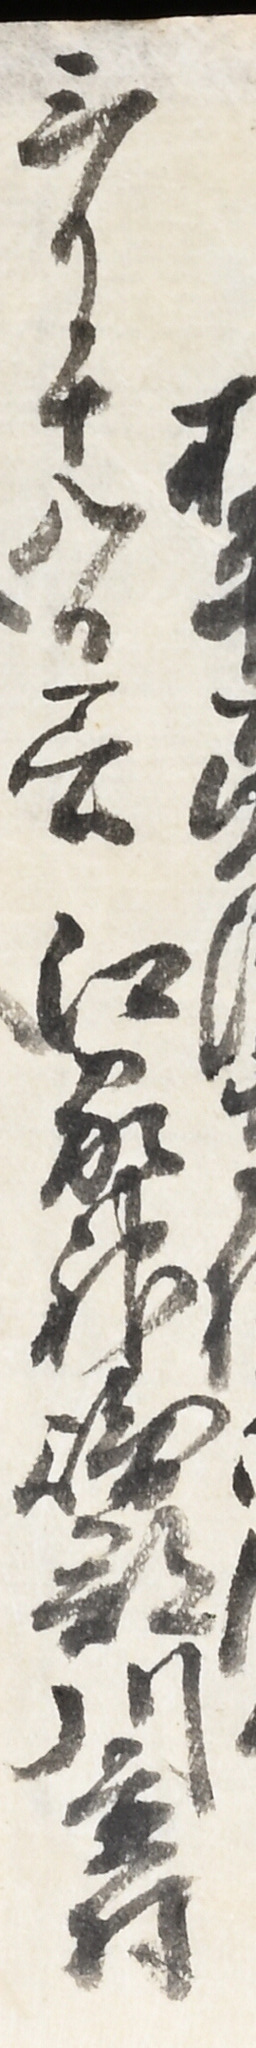三月十八日着江州神崎郡川並村
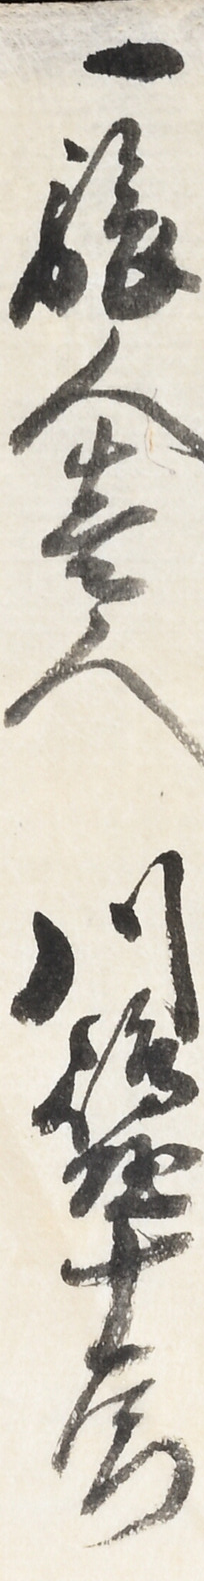一旅人壱人川嶋屋十右衛門
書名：旅人泊控帳
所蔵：伊那市立高遠町図書館・合同会社AMANE
